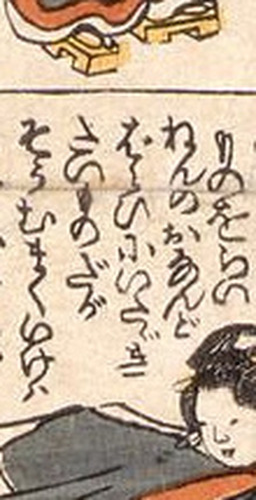ばらひにいたヾき
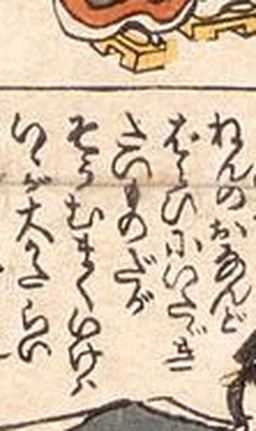たいものだが
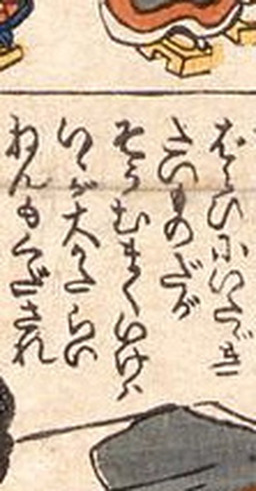そうむまくいけは
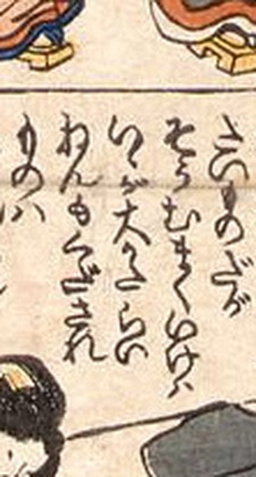いヽが大かたらい
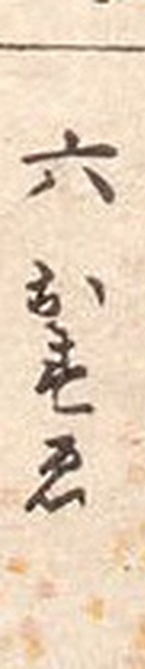六おすゑ
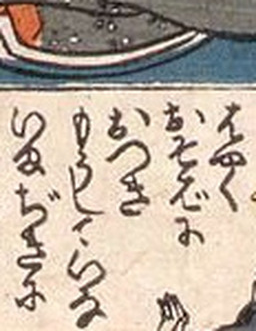おつき
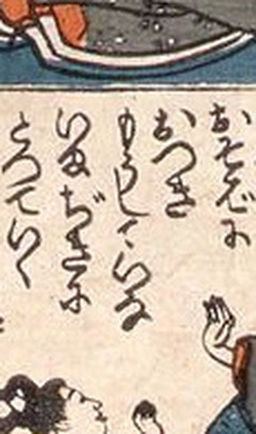もうしていな
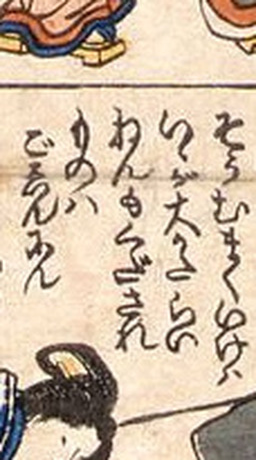ねんもくだされ
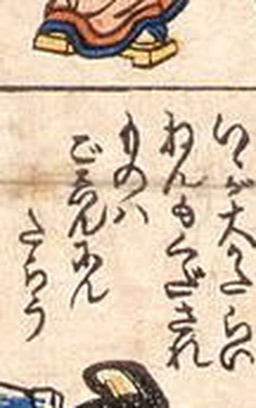ものは
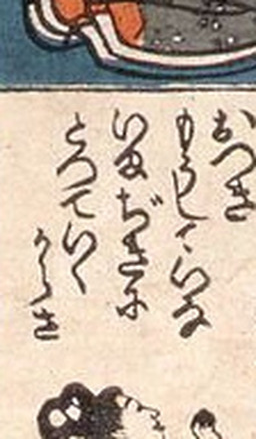いまぢきに
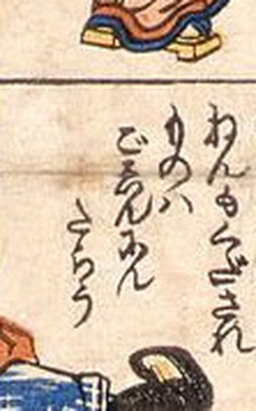ごゑんにん
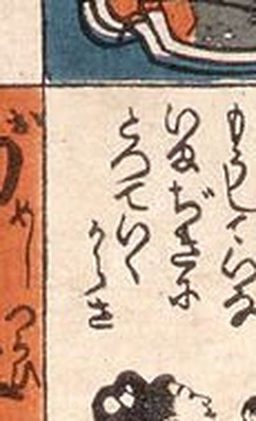とつていく
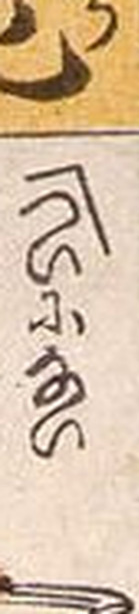〽ついにない
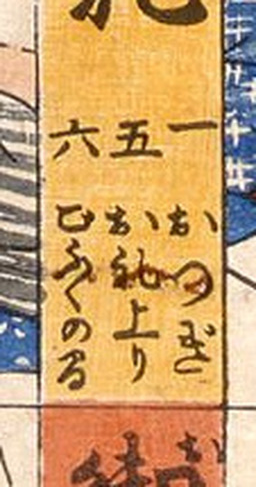三お礼上り
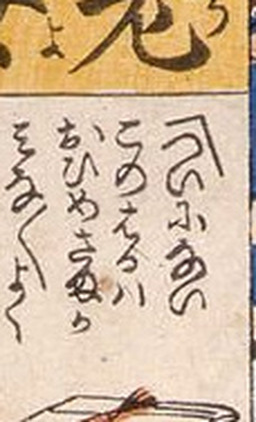このはるは
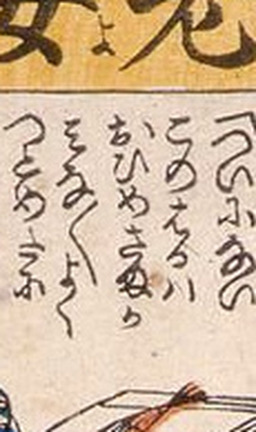おひめさまか
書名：奥奉公出世双六
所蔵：東京学芸大学教育コンテンツアーカイブ
